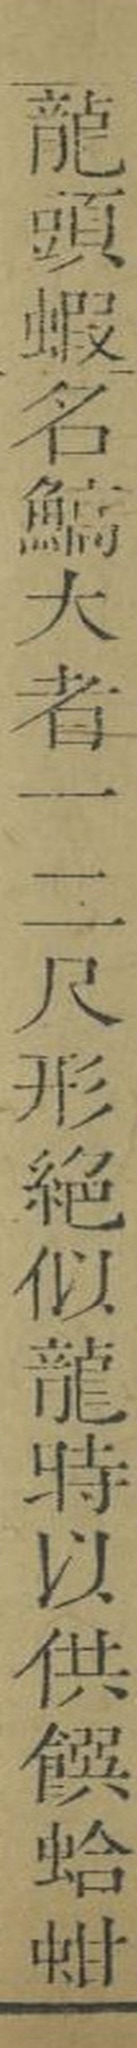[竜頭蝦]名鰝大者一二尺形絶似竜時以供饌蛤蚶
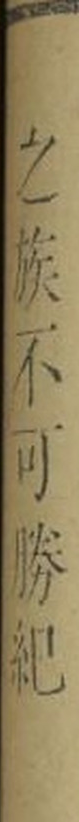之族不可勝紀
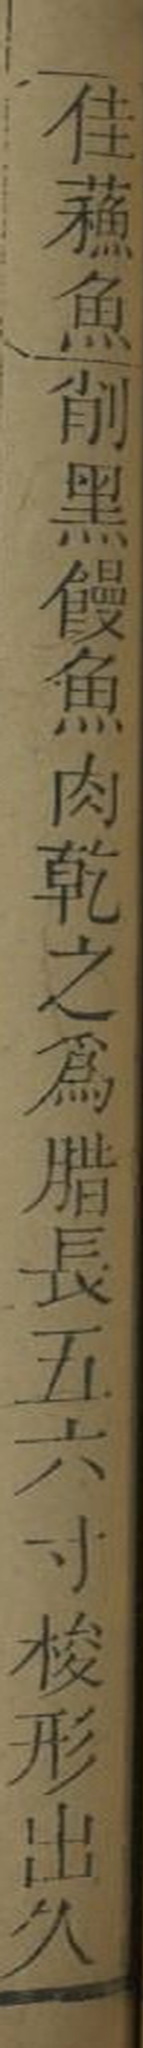[佳蘇魚]削黒饅魚肉乾之為腊長五六寸梭形出久
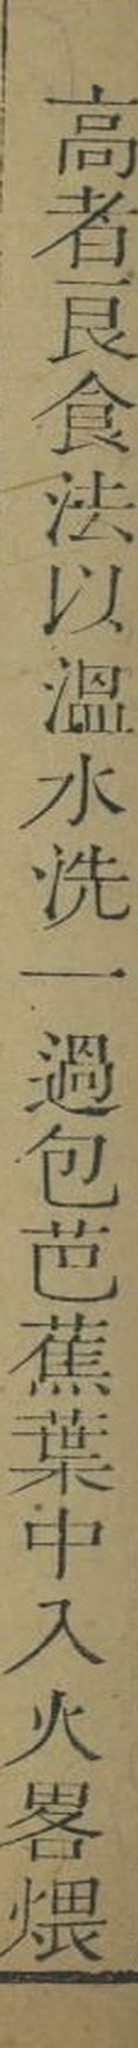高者良食法以温水洗一過包芭蕉葉中入火略煨
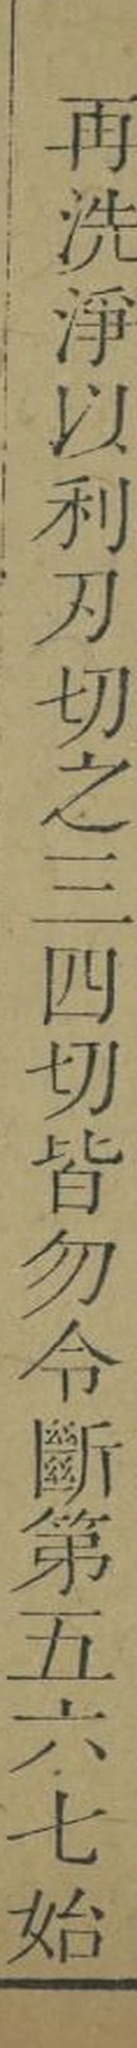再洗浄以利刃切之三四切皆勿令断第五六七始
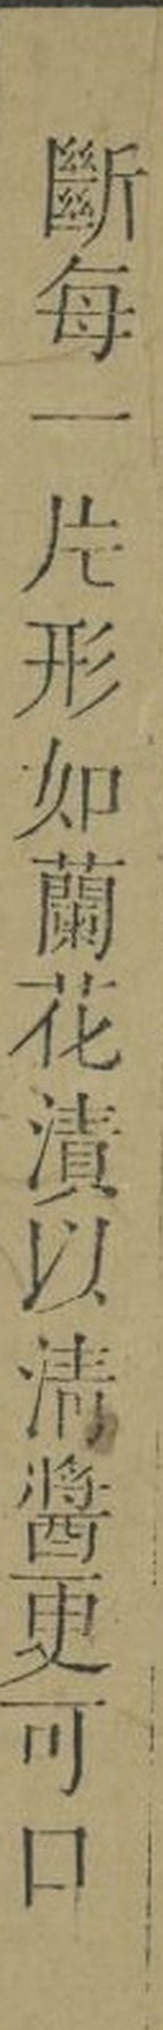断毎一片形如蘭花漬以清醬更可口
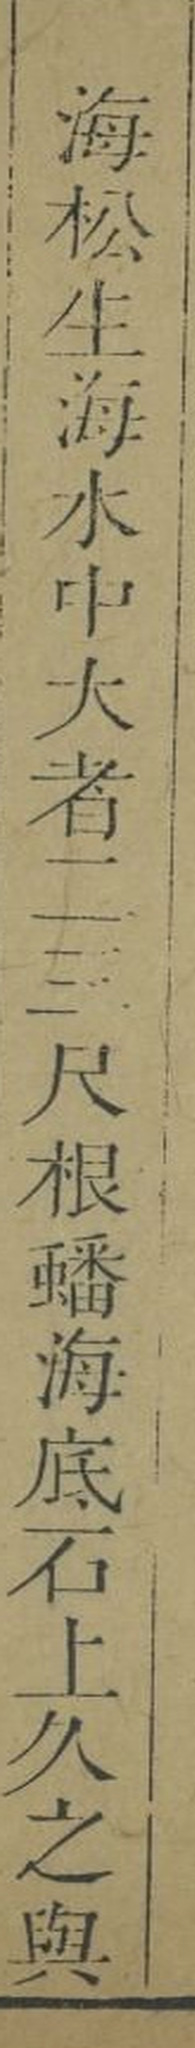海松生海水中大者二三尺根蟠海底石上久之与
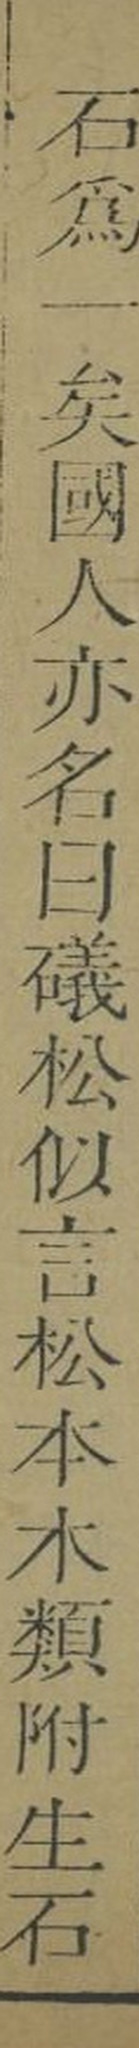石為一矣国人亦名曰礒松似言松本木類附生石
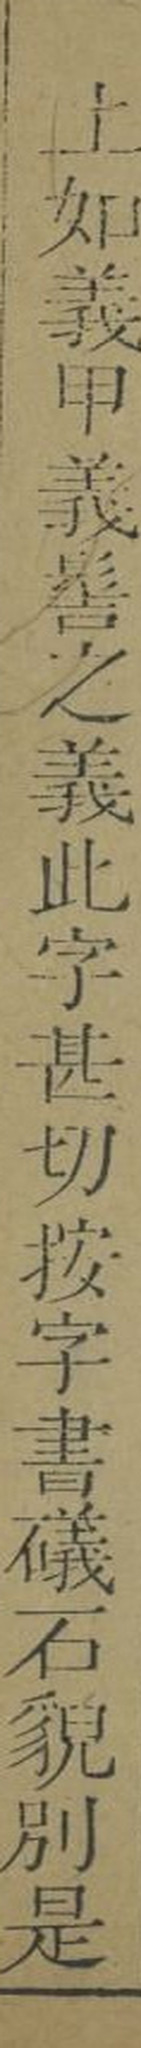上如義甲義髻之義此字甚切按字書礒石貌別是
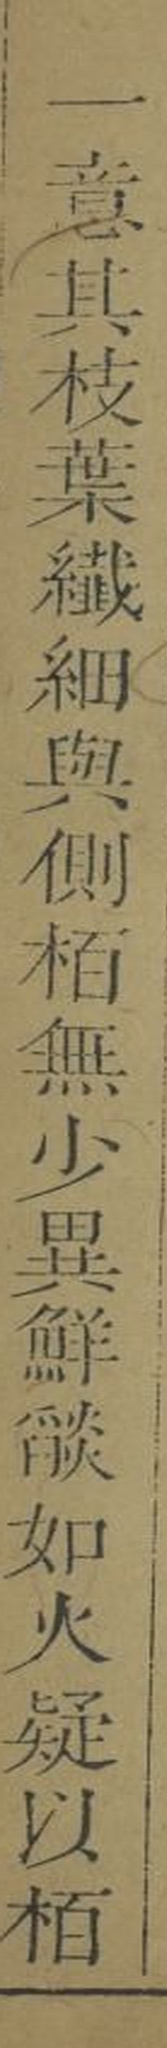一意其枝葉繊細与側栢無少異鮮燄如火疑以栢

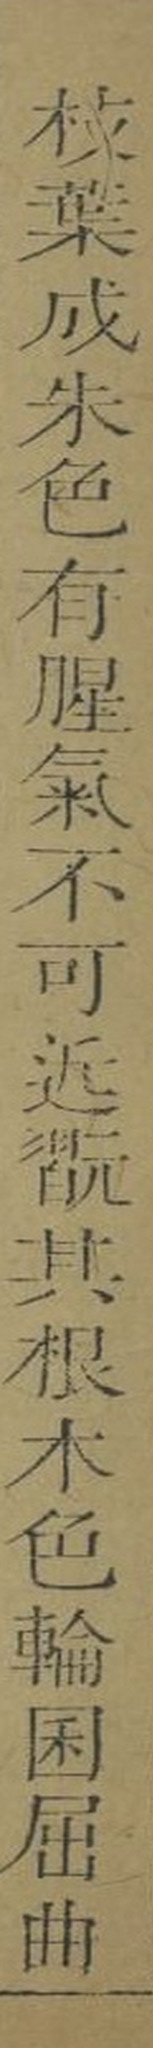枝葉成朱色有腥気不可近翫其根木色輪囷屈曲
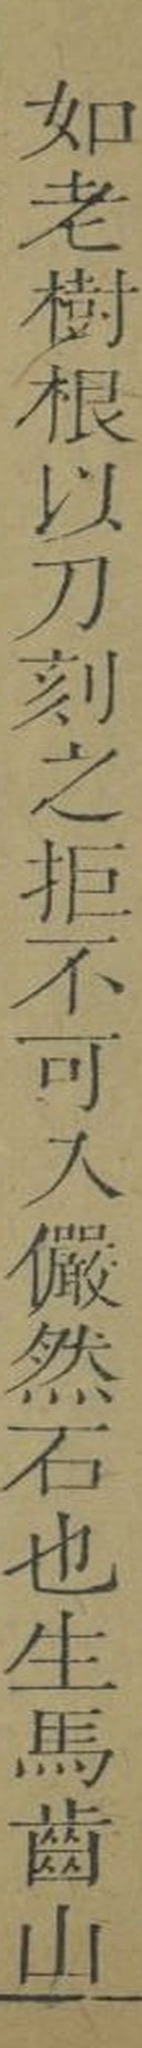如老樹根以刀刻之拒不可入儼然石也生馬歯山
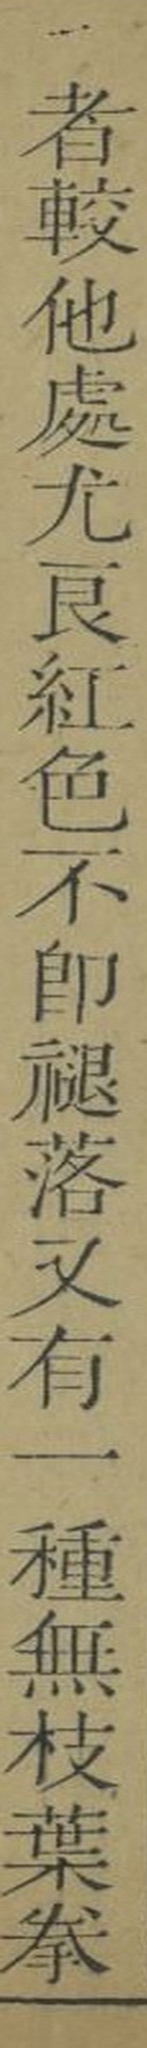者較他処尤良紅色不即褪落又有一種無枝葉拳
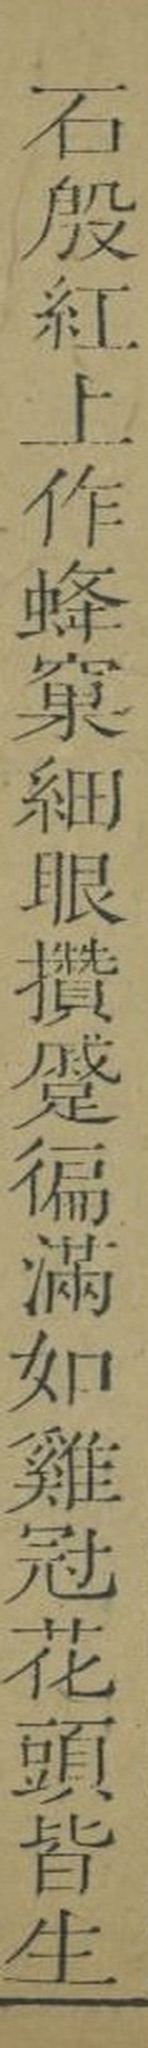石殷紅上作蜂窠細眼攢蹙徧満如鶏冠花頭皆生
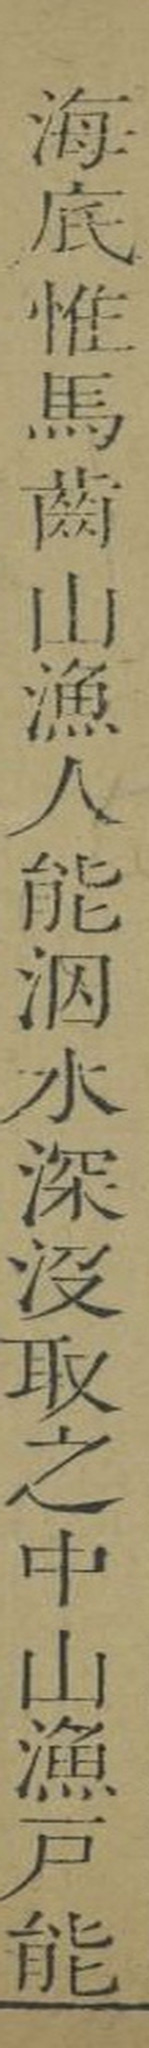海底惟馬歯山漁人能泅水深没取之中山漁戸能
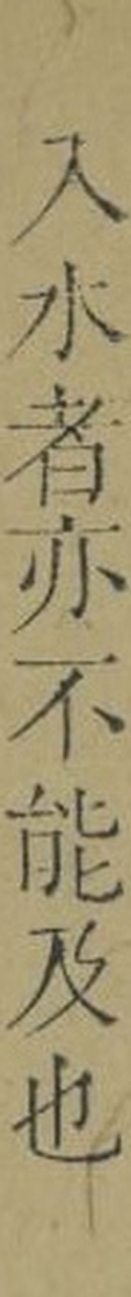入水者亦不能及也
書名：中山伝信録 巻六
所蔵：University of the Ryukyus Library
